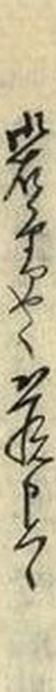御右筆部やへ恐悦申上候
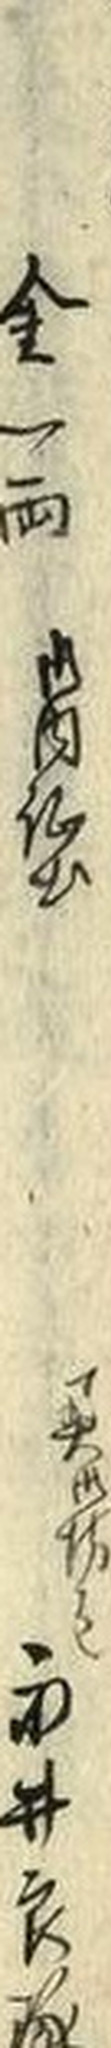金一両御内証出奥御坊主永井良瑑
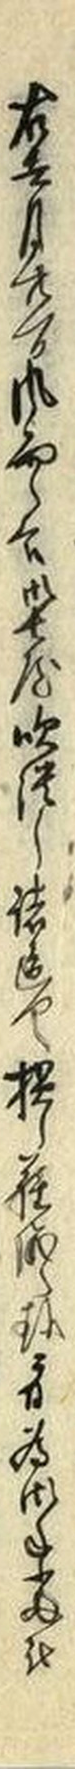右去月廿一日風雨之節御長屋吹潰し諸道具損し難儀之趣ニ付為御手当被
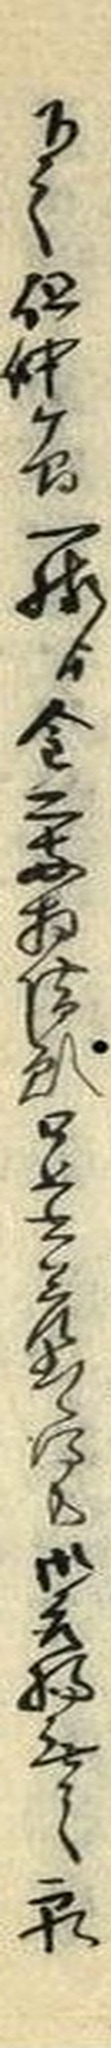下之但仲ヶ間一統ゟ金二両拝借願口上書差出候得共御取扱無之願
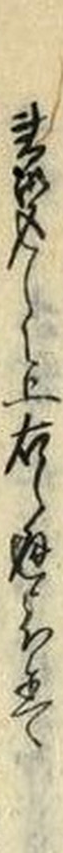書御返之上右之通被下置候
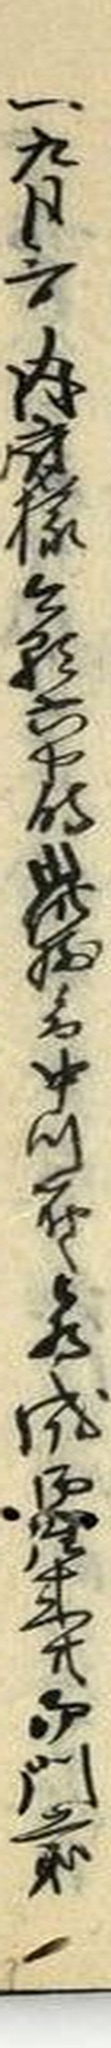一九月三日内府様今朝六半時御供揃ニ而中川筋へ被為成御往来共御門前
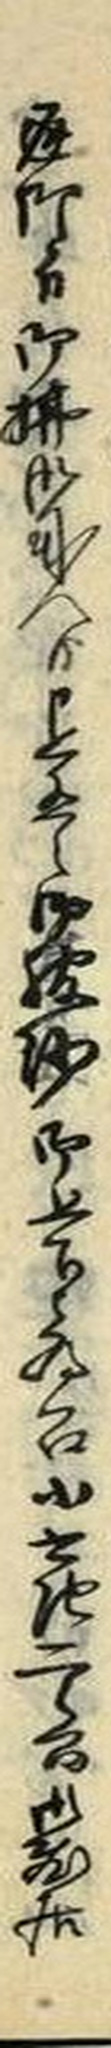通御ニ付御払御用人ゟ申上有之御服紗御上下被為召小書院二之間御敷居

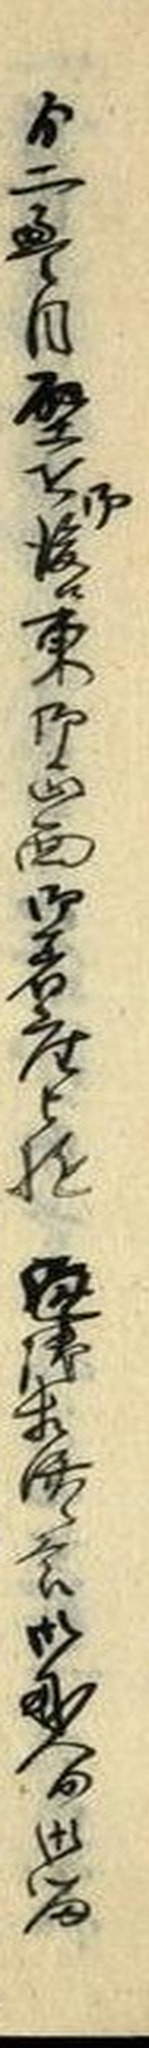ゟ二畳目壁を御後江東御正面御着座被遊通御相済候節御用人ゟ御留
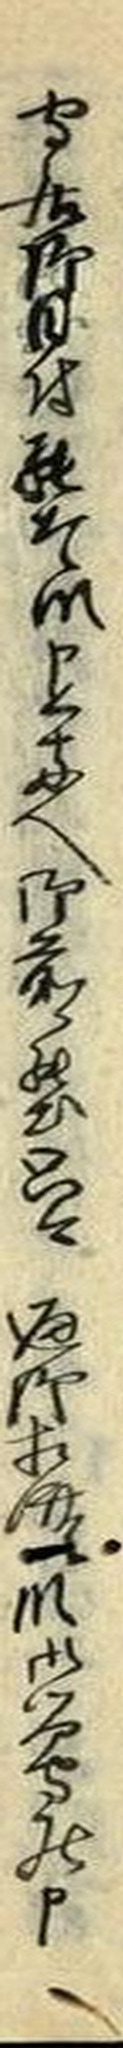守居御目付罷出候段申上両人御前へ罷出只今通御相済候段御留守居申
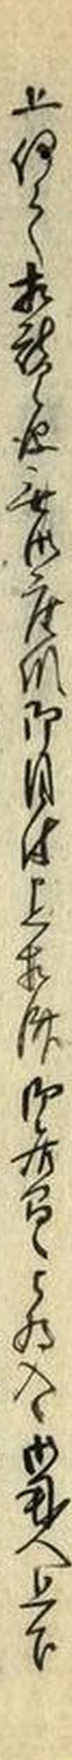上何之相替候儀無御座候段御目付申上相済御居間へ被為入候御用人上下
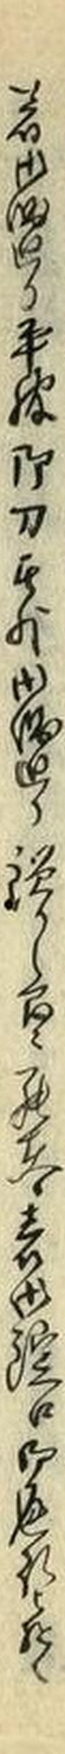着御側廻り平服御刀其外御側廻り鶴之間ニ罷在候表御錠口御通行被遊候
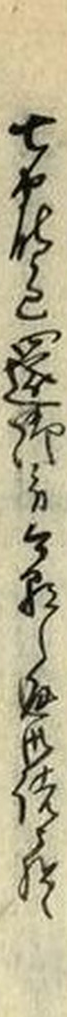七半時過還御ニ付今朝之通御詰被遊候
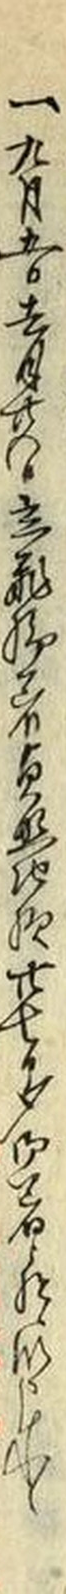一九月五日去月廿八日立飛脚着貞照院様廿七日夕御着被遊候段申来候
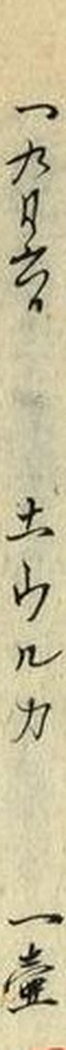一九月六日土ウルカ一台
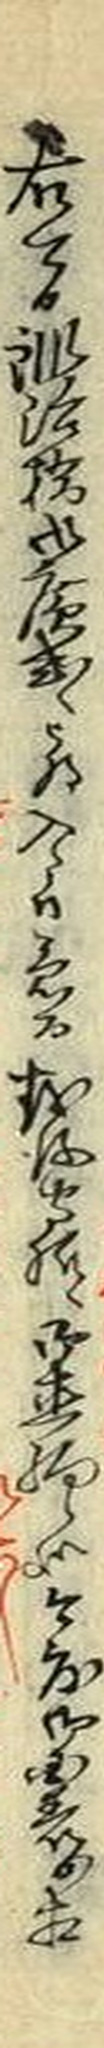右今日鍛冶橋御広式へ被為入候ニ付兼而越後守様へ御直約候処今度御国表ゟ相
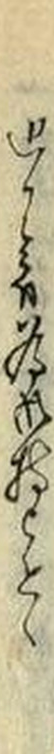廻り候ニ付為御持被進之
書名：少傅日録抄（斉承付側向頭取日記、在府）
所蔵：福井県文書館 Fukui Prefectural Archives
